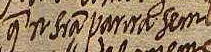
q̄ n srā parira sem
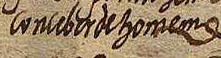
conceber de homem
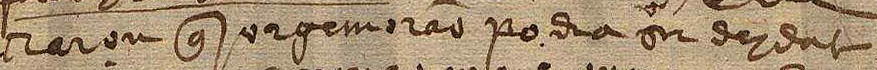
crarou q̄ Jorge moraõ podia ser de jdade
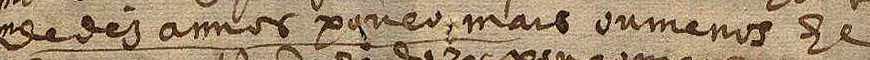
de dez annos pouco mais ou menos he
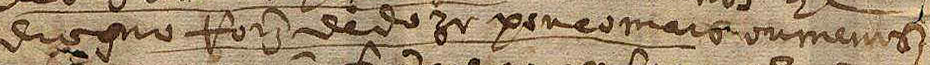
dioguo Roiz̄ de doze pouco mais ou menos
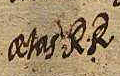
ætas R. R.
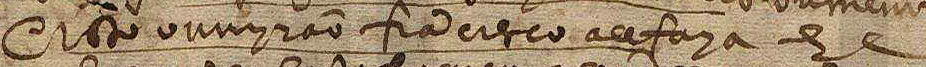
e isto ouuyraõ frācisco allfaya he
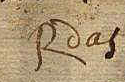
Rdas
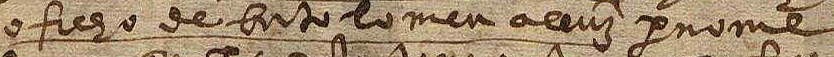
o filho de bertolomeu alluz̄ ꝑ nome
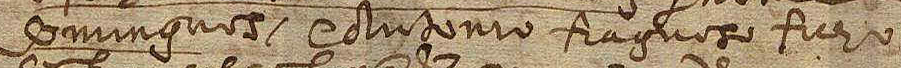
dominguos / e Antonio fraguoso filho
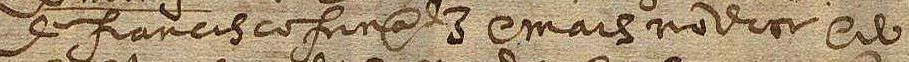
de francisco fernādez e mais nō dise e do
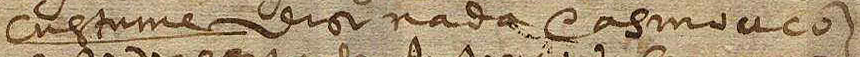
custume dise nada e asinou cō
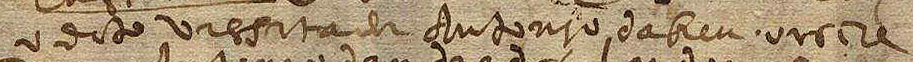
o dito vissitador Antonjo dabreu o escre
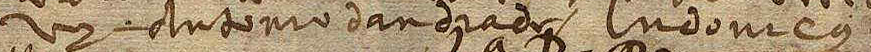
vy Antonio dandrade Ludouicꝯ
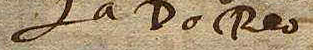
ta Do Reo
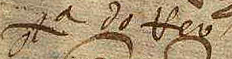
ta do Reo
